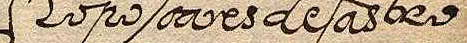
Lopo Soares de Castro
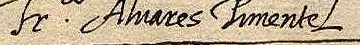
Fr.co Aluares Pimentel
